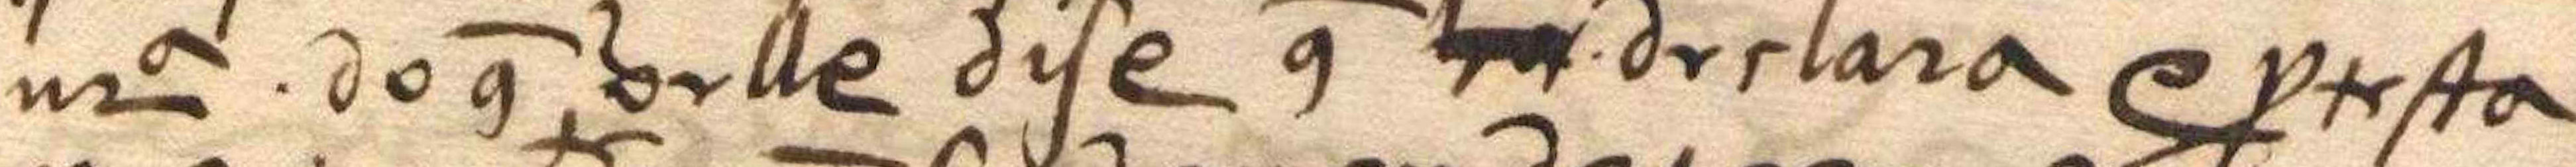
nra. do q̄ o elle dise q̄ _ declara e ꝓtesta
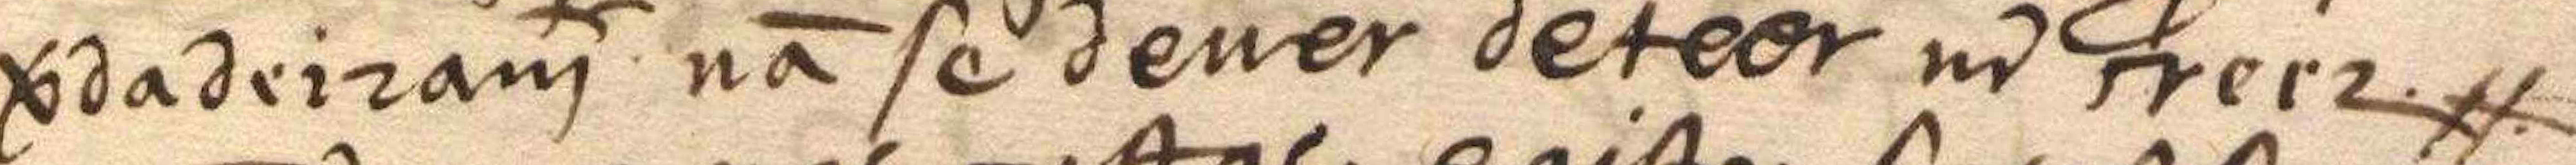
ꝟdadeiramte. nā se deuer de teer nem creer.//.
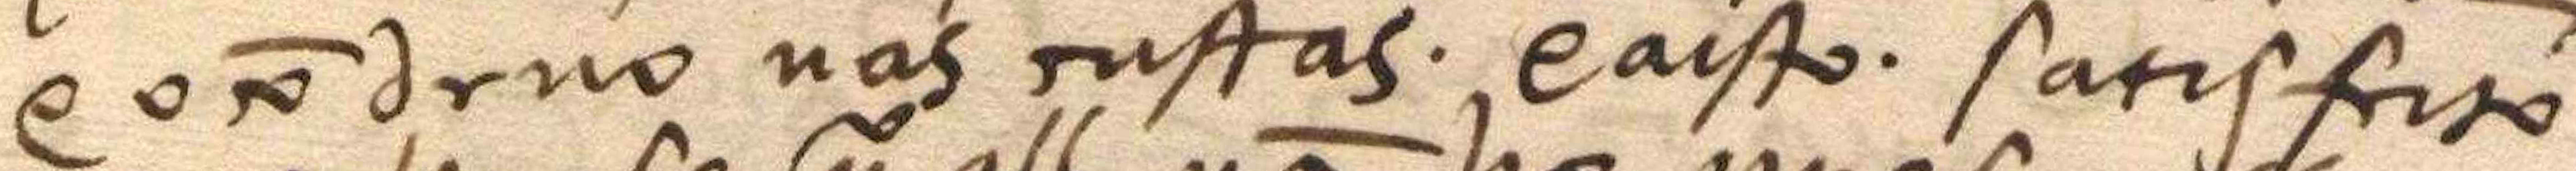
e o c̄odeno nas custas. e a isto. satisfeito
